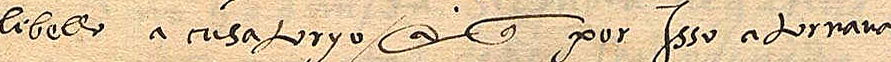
lebello acusatoryo / e̅ q̅ por Jsso a tornaua
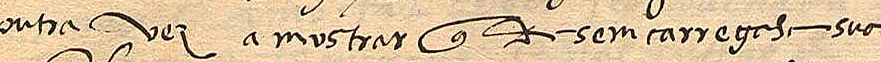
outra vez a mostrar q̅ desemcarregase sua
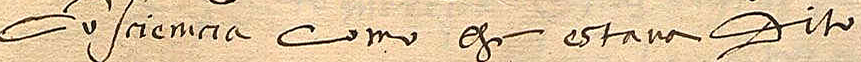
Co̅sciemcia como lhe estaua Dito
